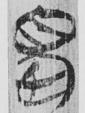愧（威）
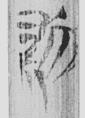則
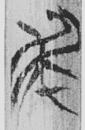民
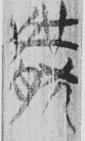○（乘）
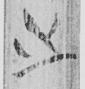之
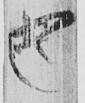母
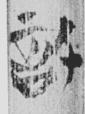信
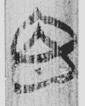玄
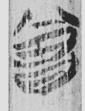曾
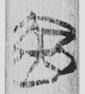因
